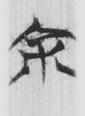余
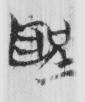聖
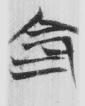命
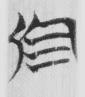於
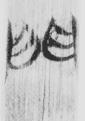門
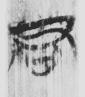君
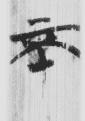不
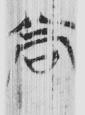尚
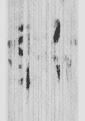{辛斤}
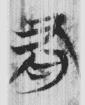有
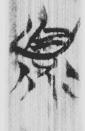寡
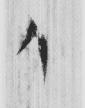人
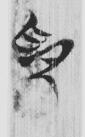卬
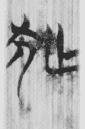{犬亡}
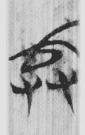弃
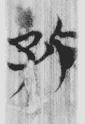孤
